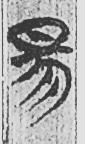昜
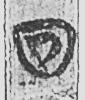回
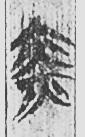赤
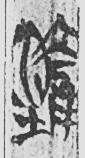{水产隹土}
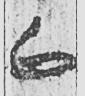㠯（以）
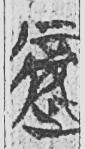復
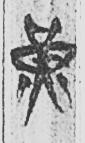黃
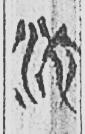池
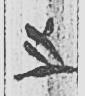之
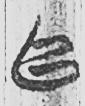𠂤
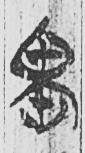{鬼山}
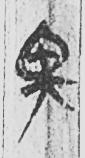𢍉
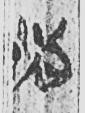{少勺}
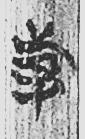倝
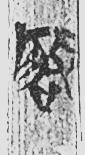啟
